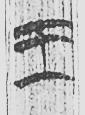王
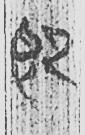即
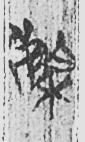殜
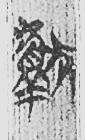獻
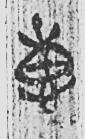惠
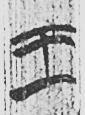王
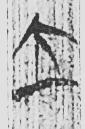立
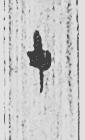十
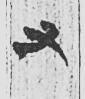又
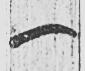一
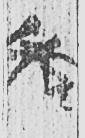年
